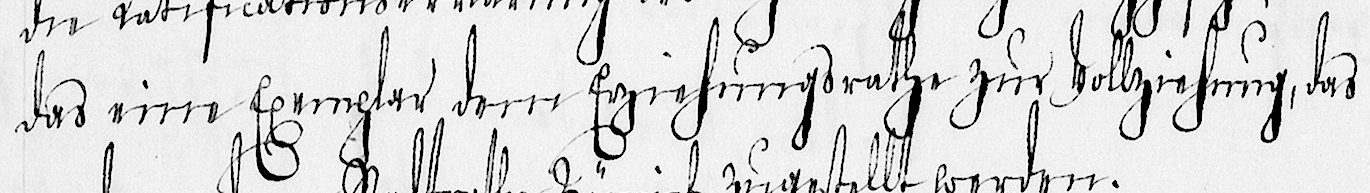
das eine Exemplar dem Erziehungsrathe zur Vollziehung, das
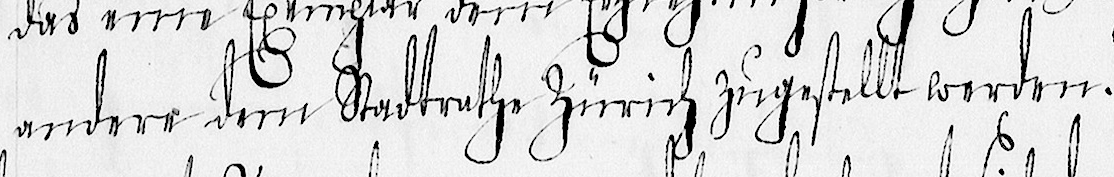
andere dem Stadtrathe Zürich zugestellt werden.
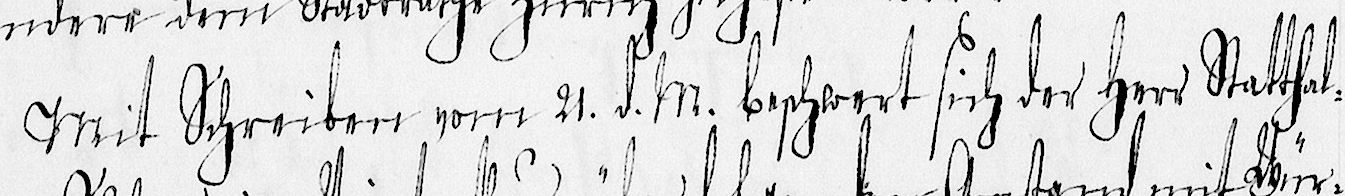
Mit Schreiben vom 21. d. M. beschwert sich der Herr St¬
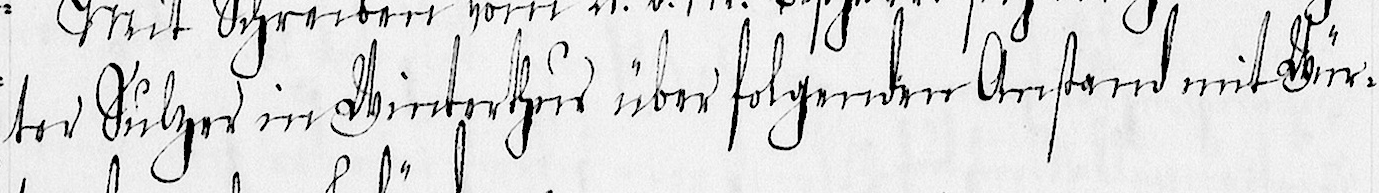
ter Sulzer in Winterthur über folgenden Anstand mit Wür¬
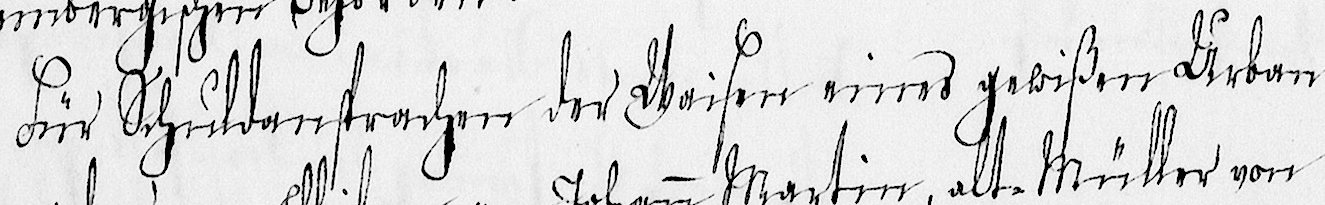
Für Schuldansprachen der Waisen eines gewißen Urban
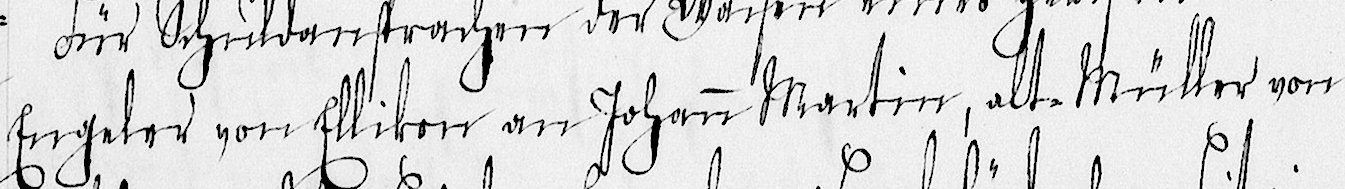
Engeler von Ellikon an Johann Martin, alt-Müller von
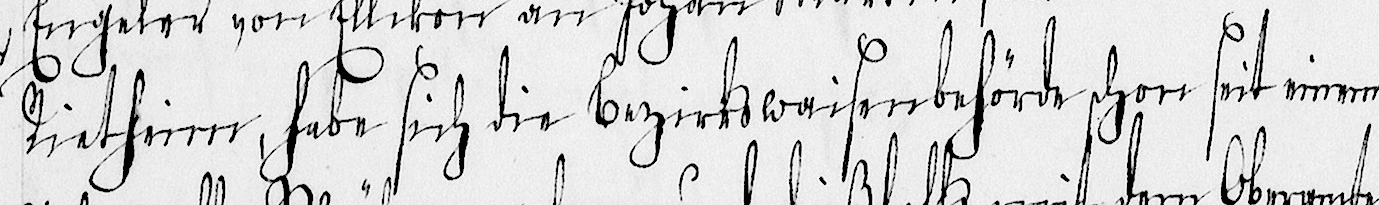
Rietheim, habe sich die Bezirkswaisenbehörde schon seit ein¬
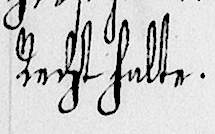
atthal¬
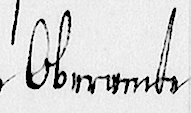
Oberamte
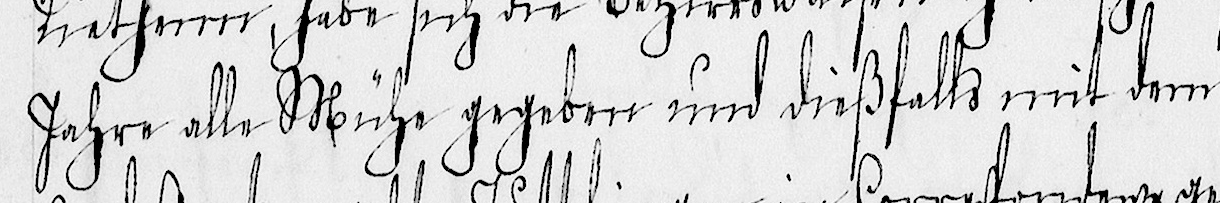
Jahre alle Mühe gegeben und dießfalls mit dem
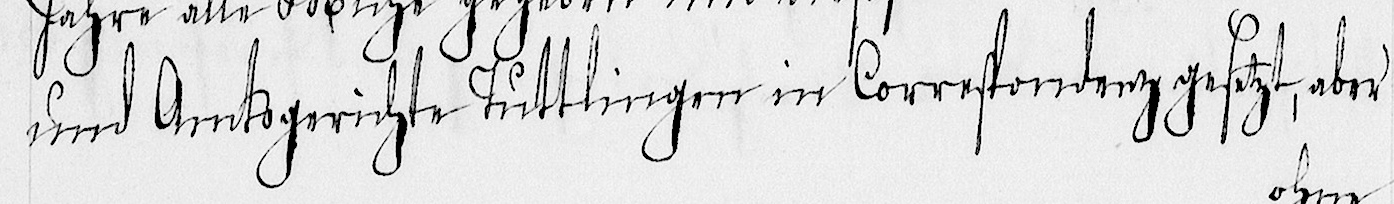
und Amtsgerichte Tuttlingen in Correspondenz gesetzt, aber
